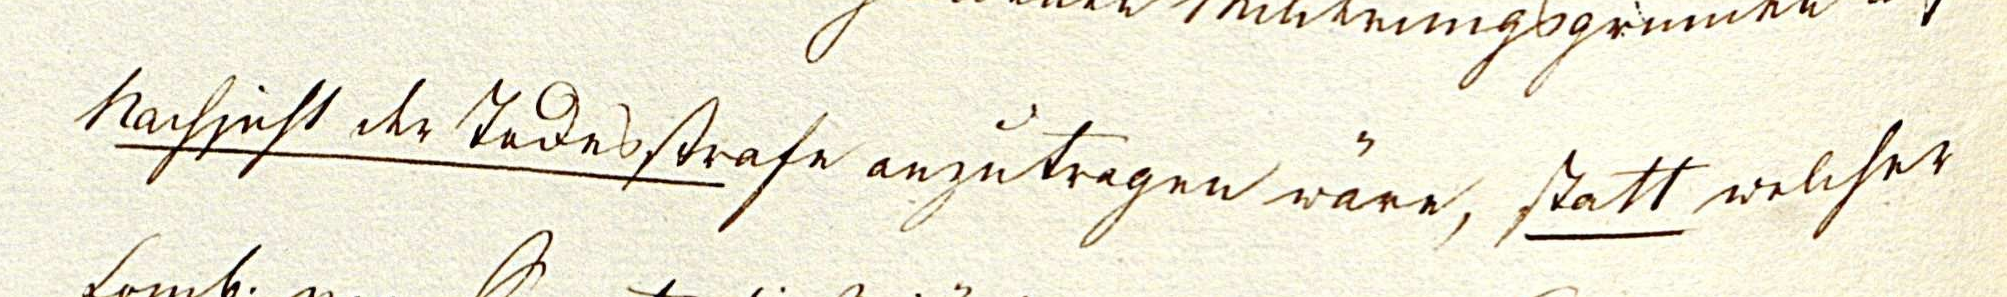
Nachsicht der Todesstrafe anzutragen wäre, statt welcher
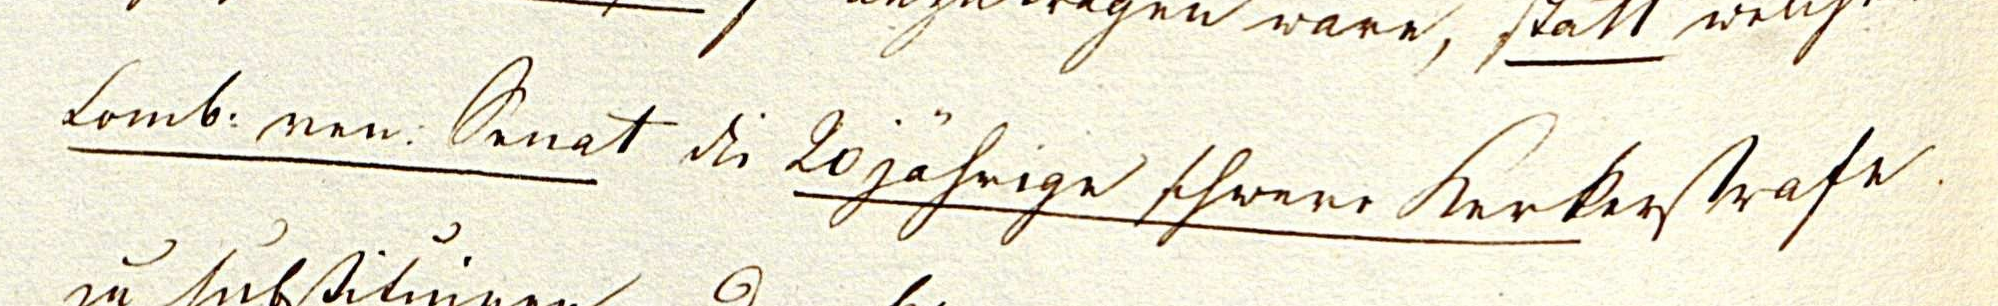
Lomb: ren: Senat die 20jährige schwere Kerkerstrafe
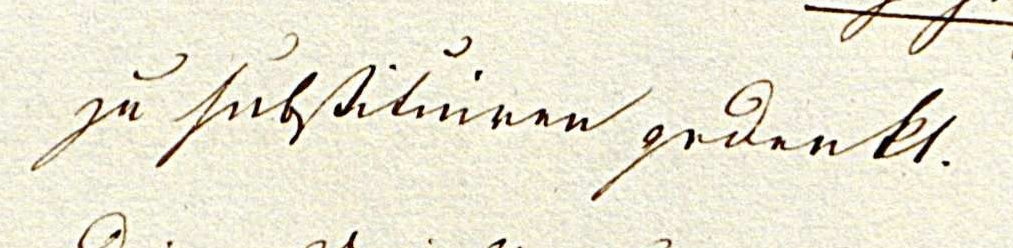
zu substituiren gedenkt.
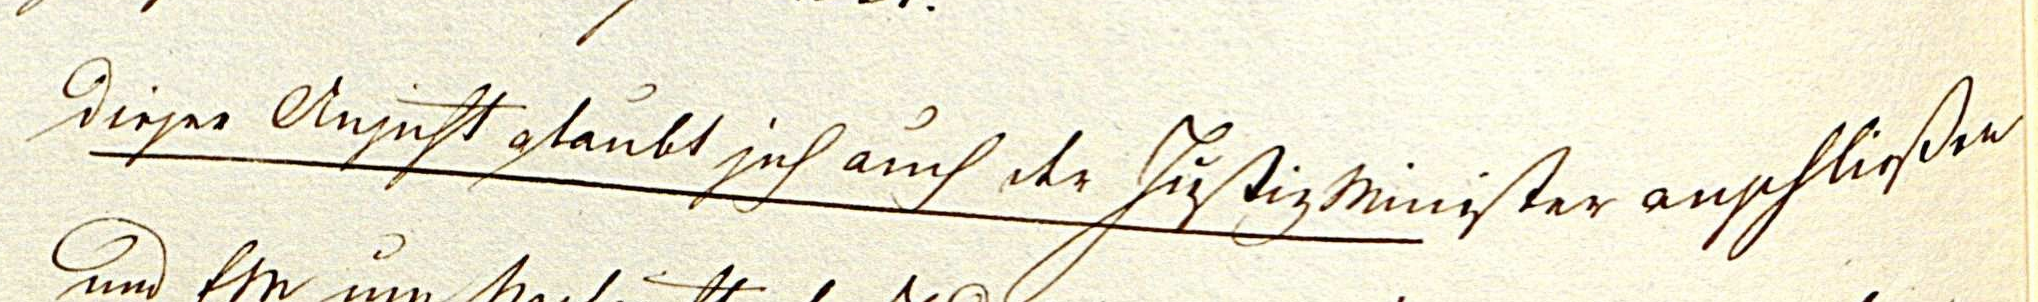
Dieser Ansicht xxaubt sich auch der Justiz Minister anschließen
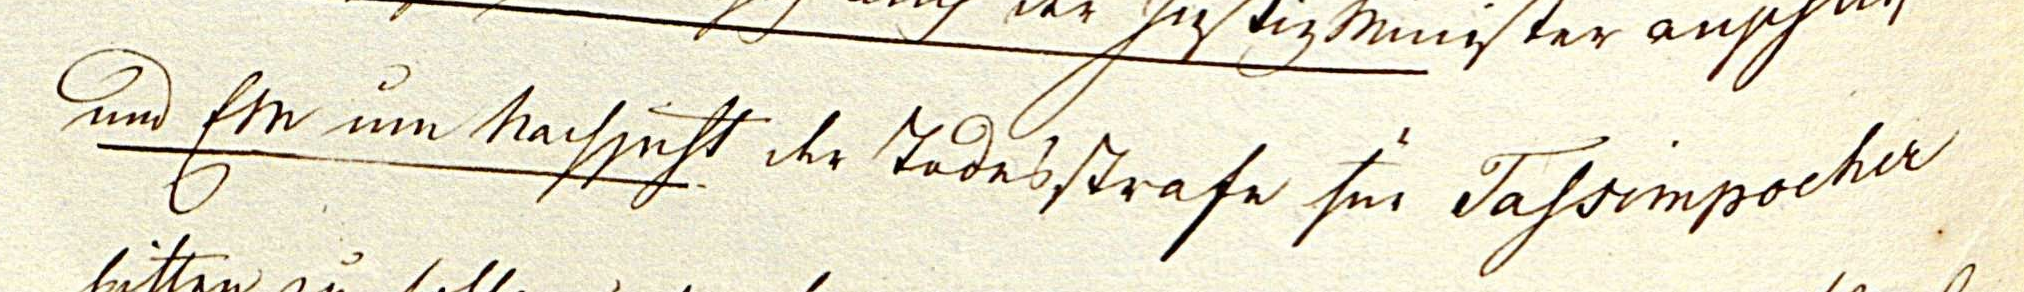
und EM um Nachsicht der Todesstrafe für Tassimpocher
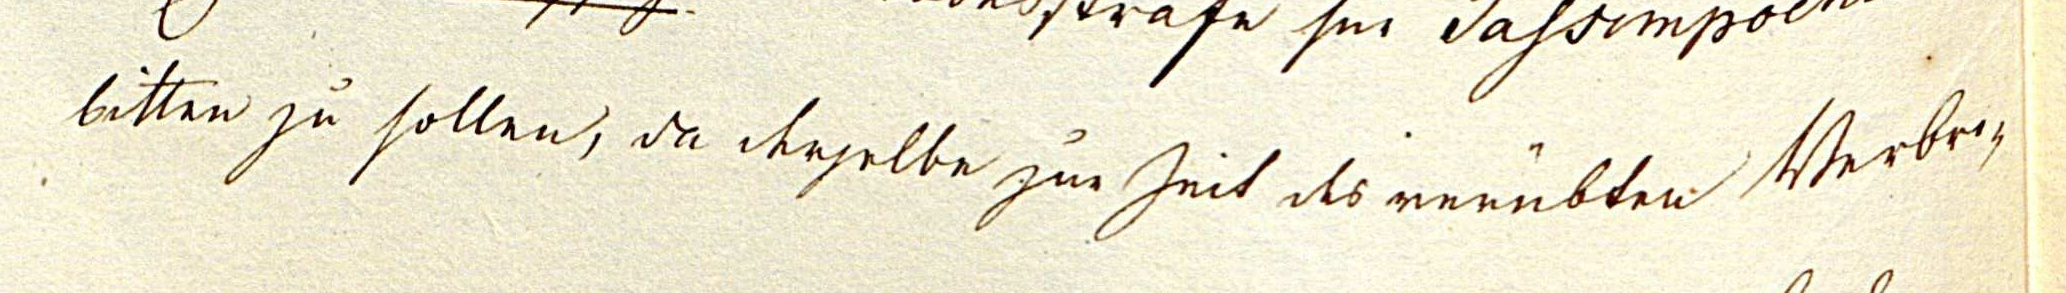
bitten zu solle, da derselbe zur Zeit des verübten Werbre¬
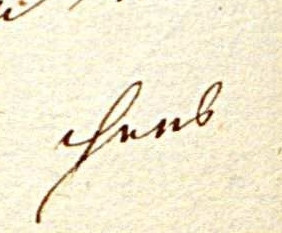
chens
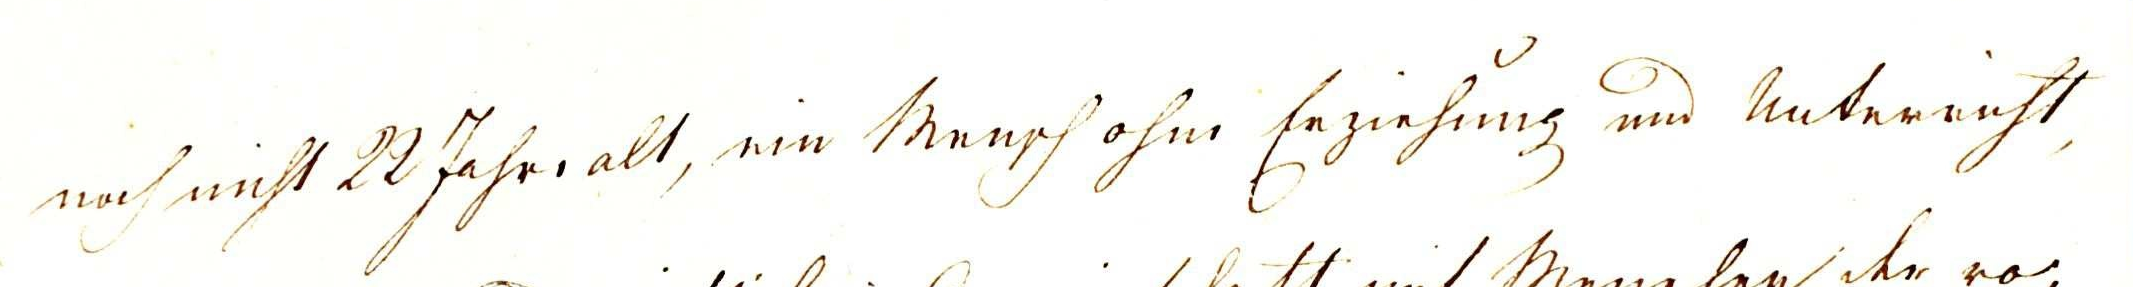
noch nicht 22 Jahre alt, ein Mensch ohne Erziehung und Unterricht,
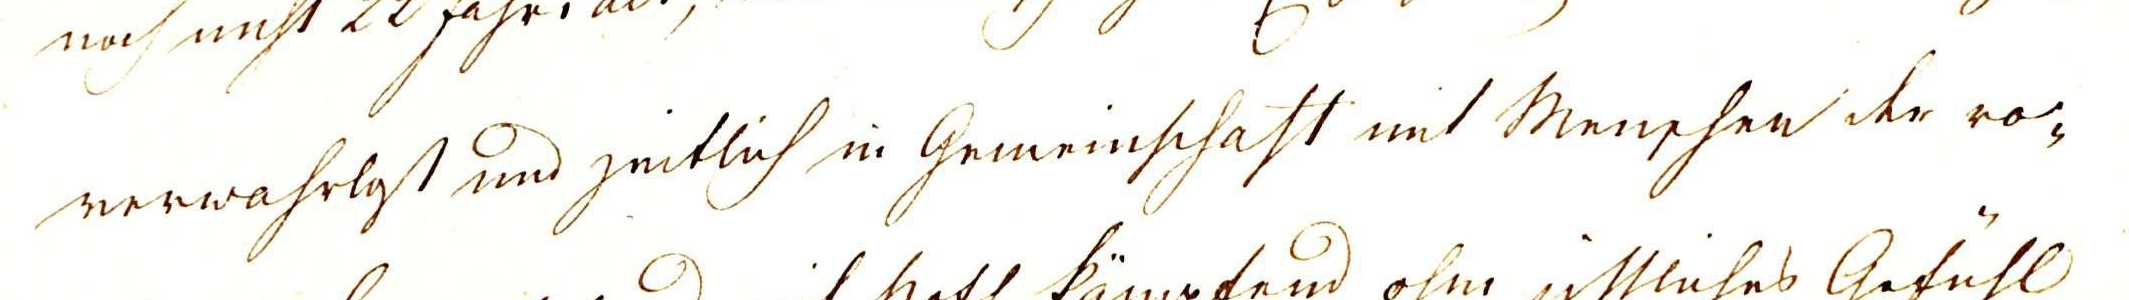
verwahrlost und zeitlich in Gemeinschaft mit Menschen ihr ro¬
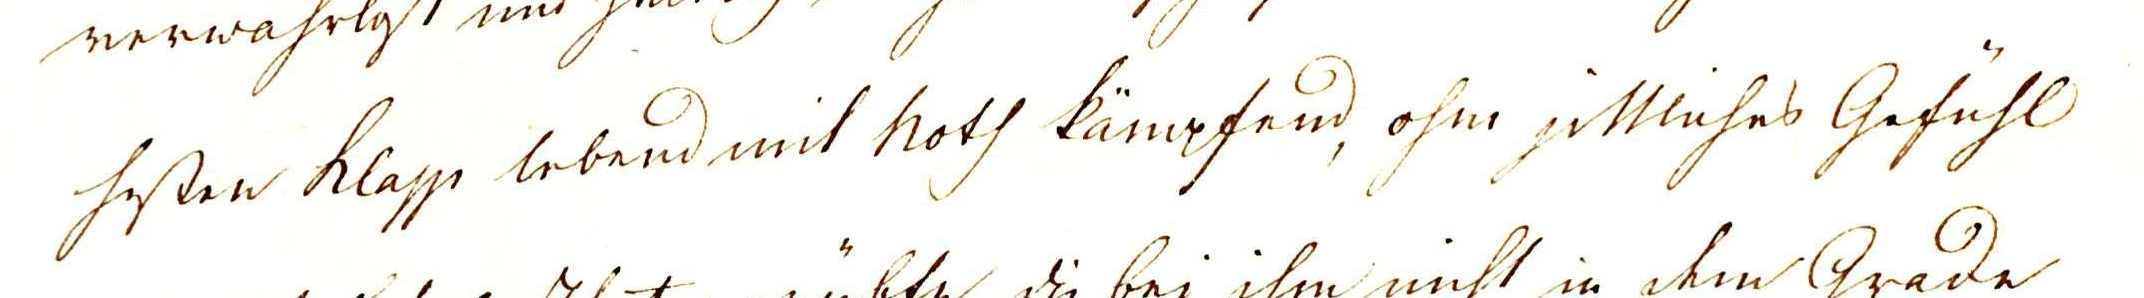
hesten Klasse lebend mit Roth Kämpfend, ohne sittliches Gefehl
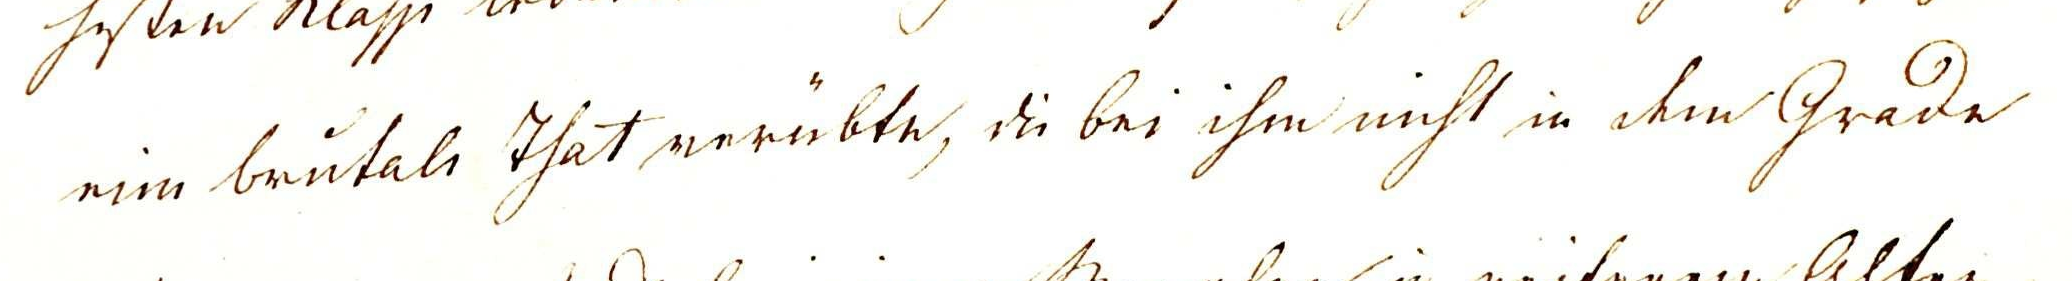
eine brutale That errübte, die bei ihm nicht in dem Grade
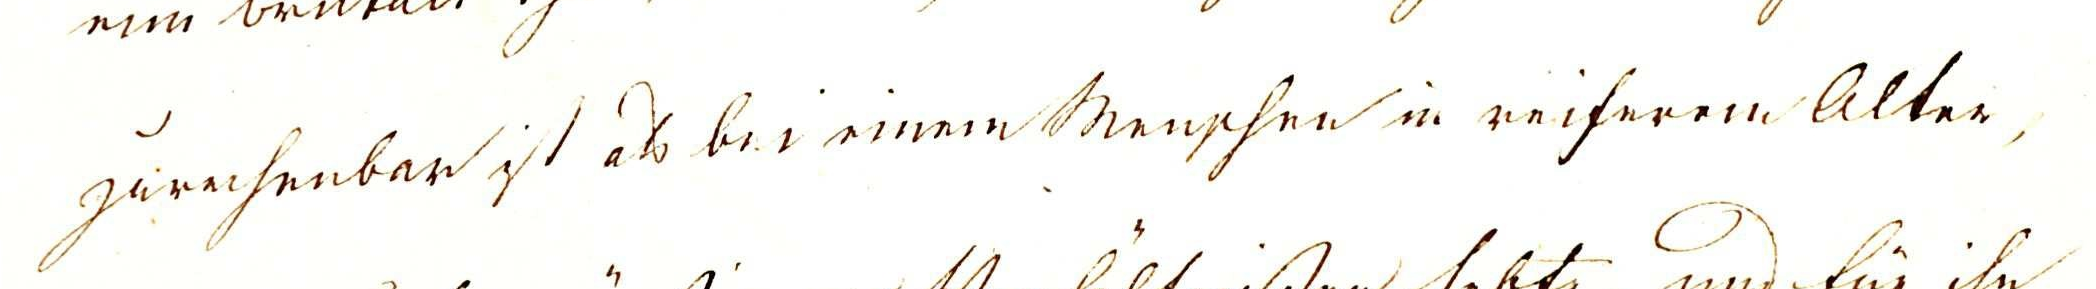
zurechenbar ist als bei einem Menschen in weiherem Alter,
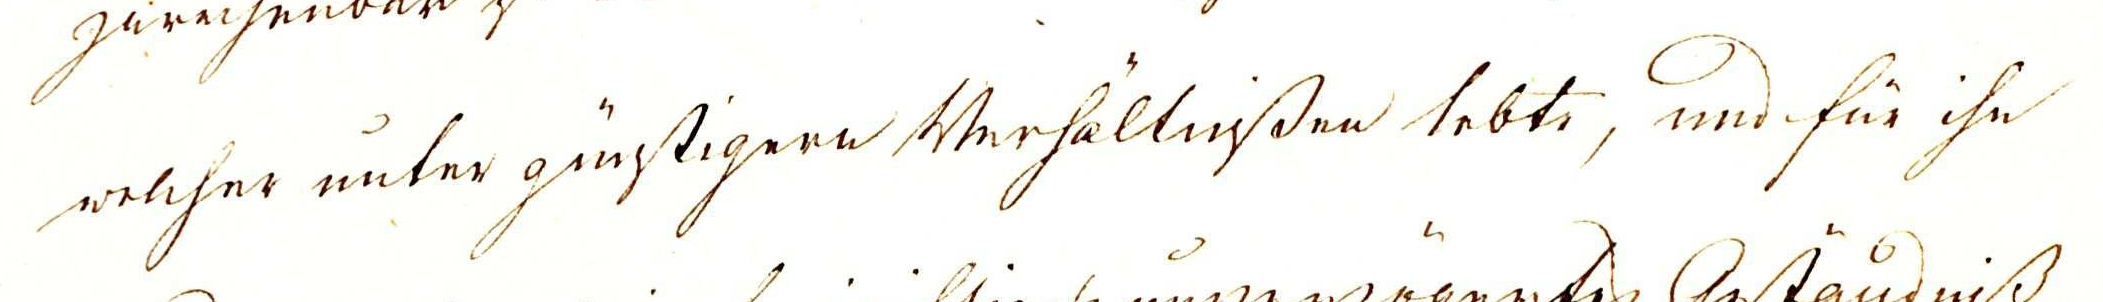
welcher unter günstigern Verhältnißen lebte, und für ihn
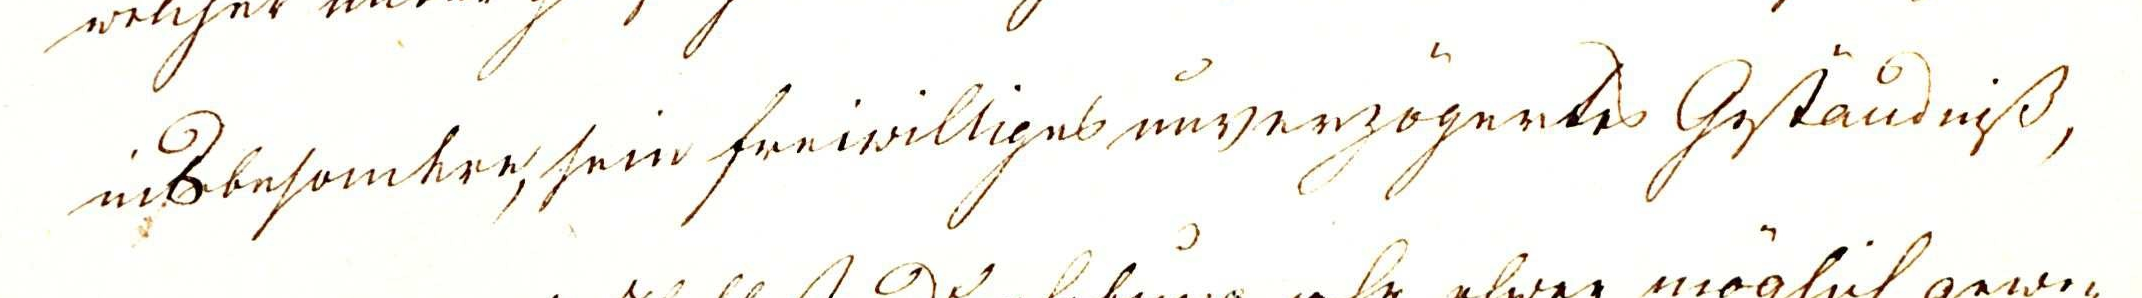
eisbesondere, sein freiwilliges unverzögertes Geständniß,
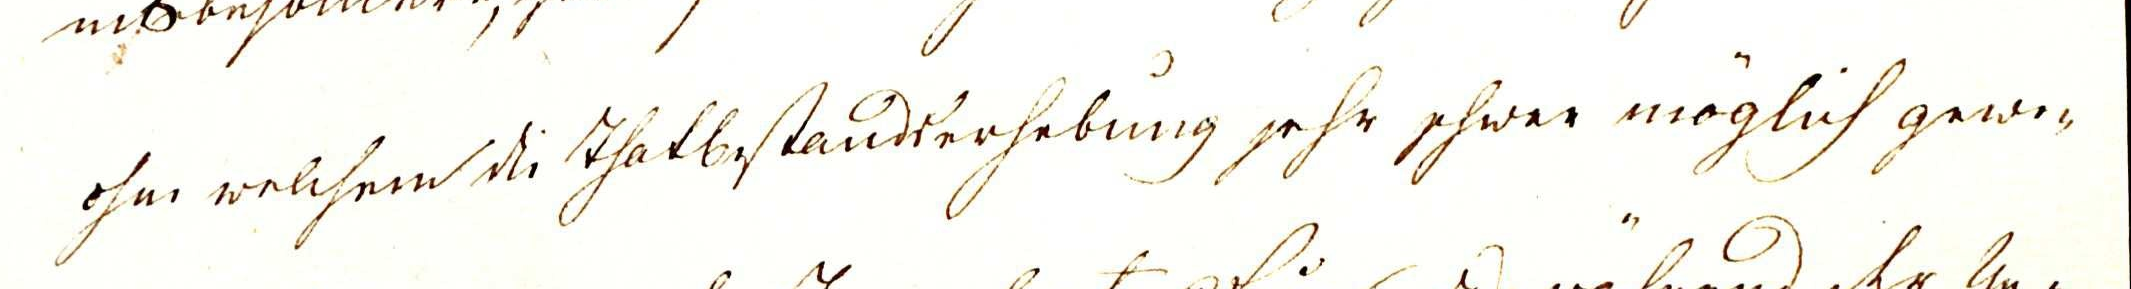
ohne welchem die Thatbestanderhebung sehr schwer möglich gewe¬
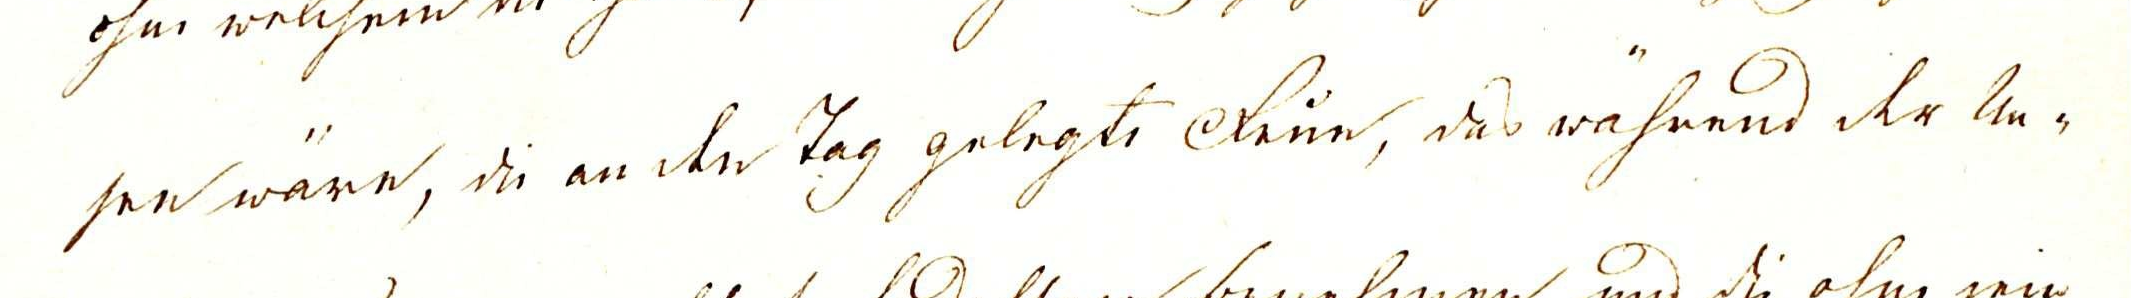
sen wäre, die an den Tag gelegte Feue, das während der Un¬
